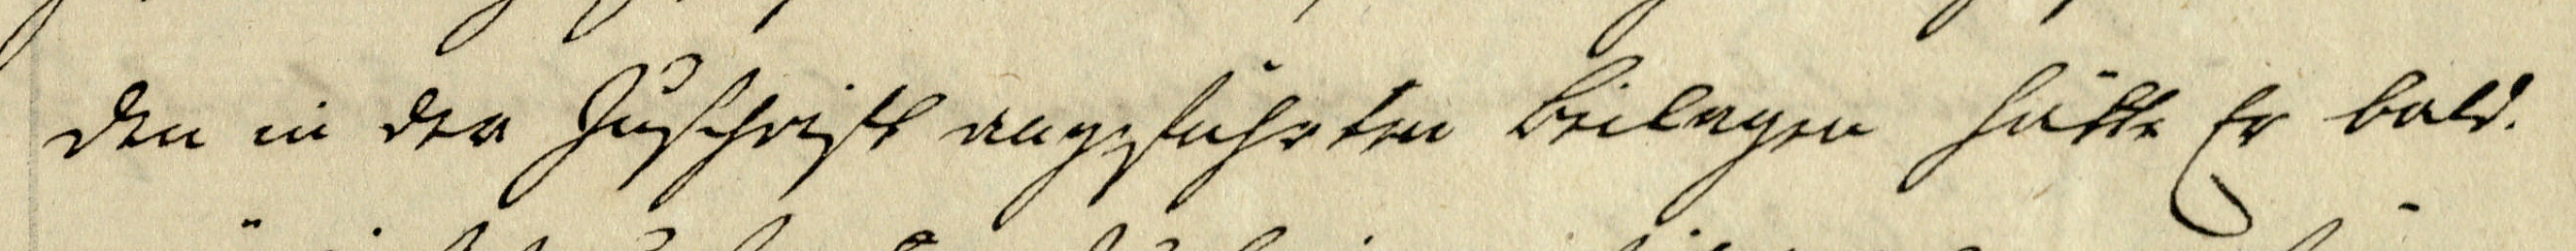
den in der Zuschrift angeführten Beilagen hätte Er bald¬
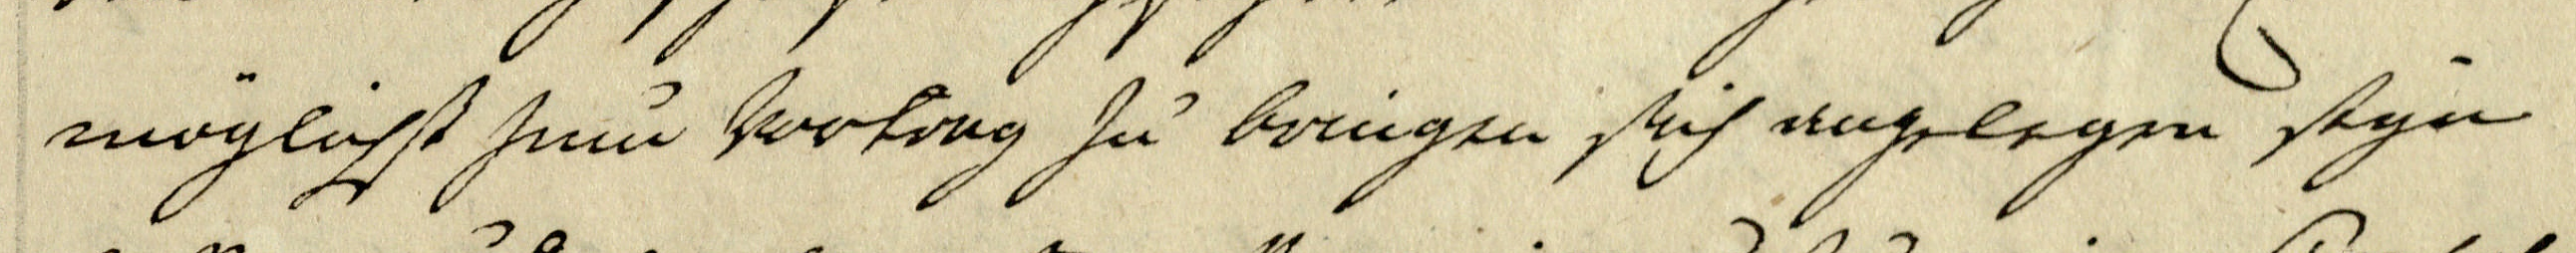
möglichst zum Vortrag zu bringen sich angelegen seÿn
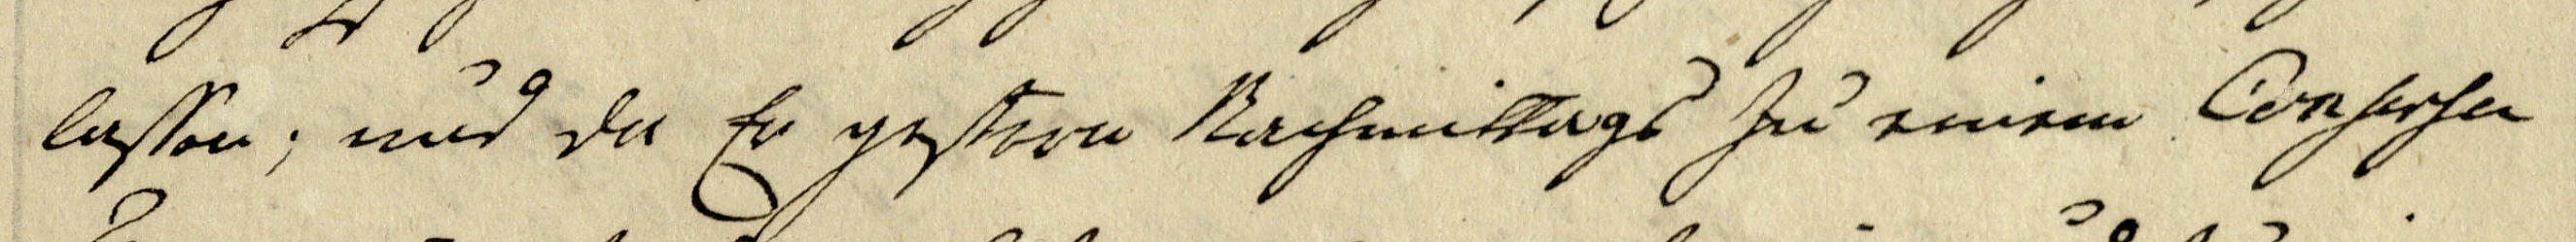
lassen; und da Er gestern Nachmittags zu einem Consessu
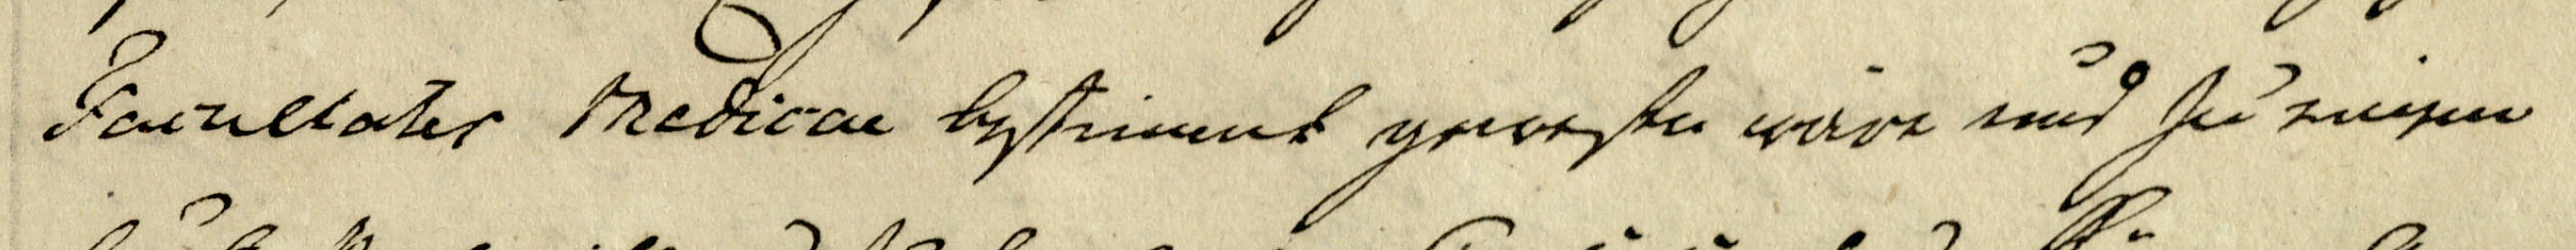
Facultatis Medicae bestimmt gewesen wäre und zu einem
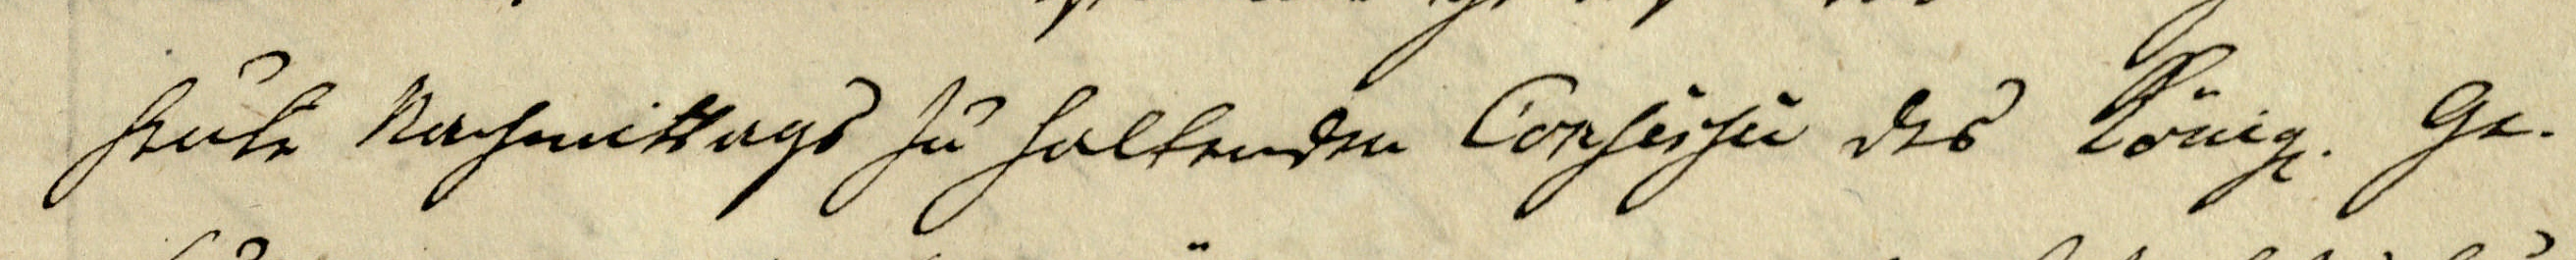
heute Nachmittags zu haltenden Consessu des König. Ge¬
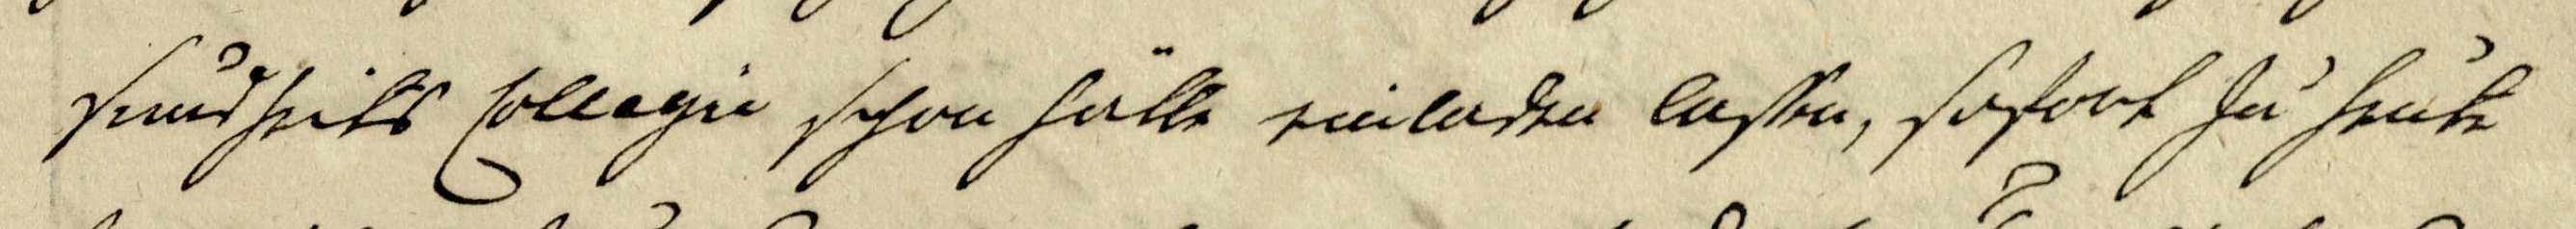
sundheits Collegii schon hätte einladen lassen, sofort zu heute
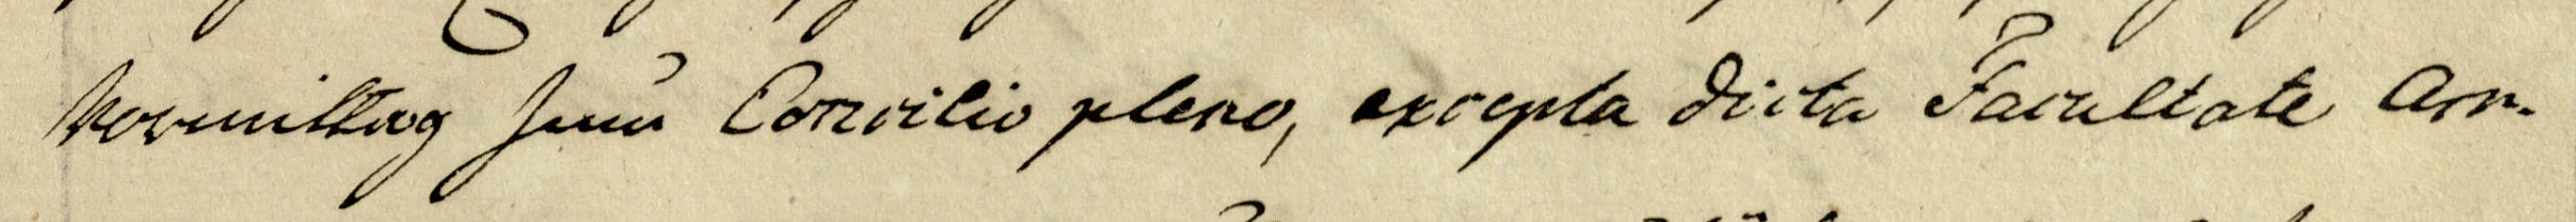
Vormittag zum Concilio pleno, excepta dicta Facultate Am¬
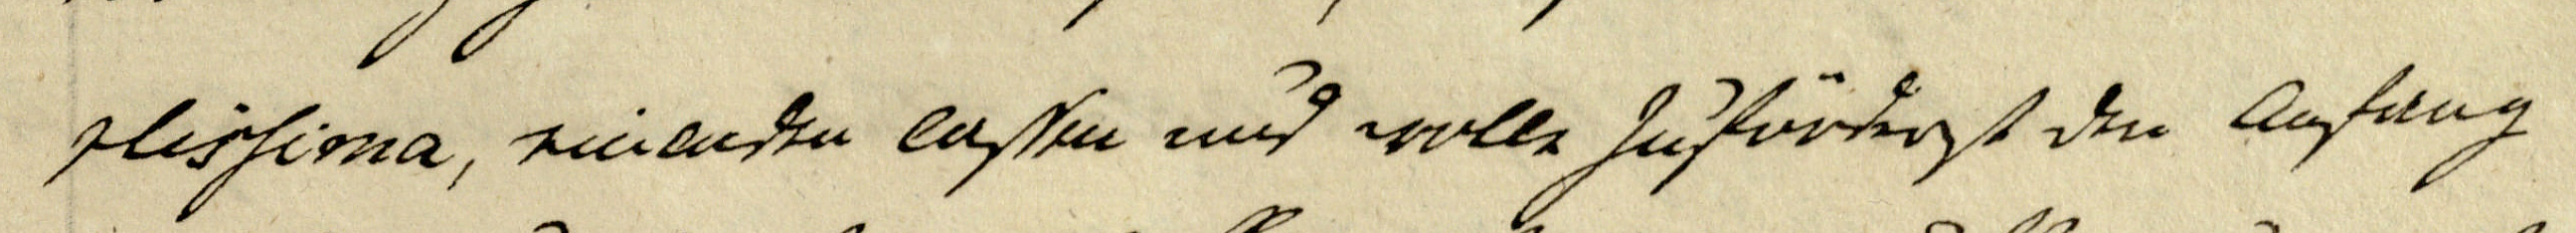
plissima, einladen lassen und wolle zuförderst den Anfang
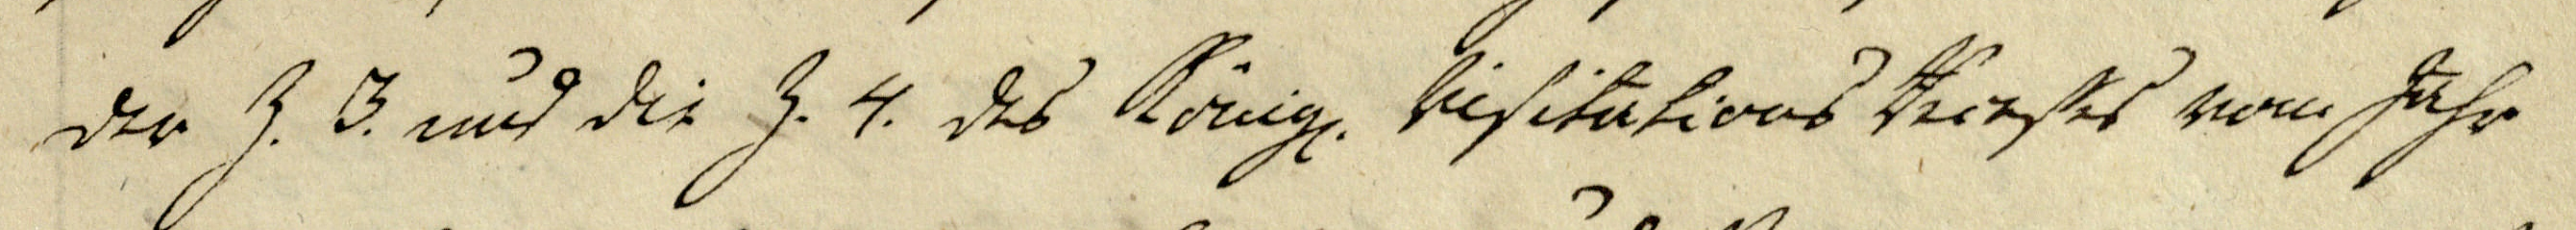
der Z. 3. und die Z. 4. des König. Visitations Receßes vom Jahr
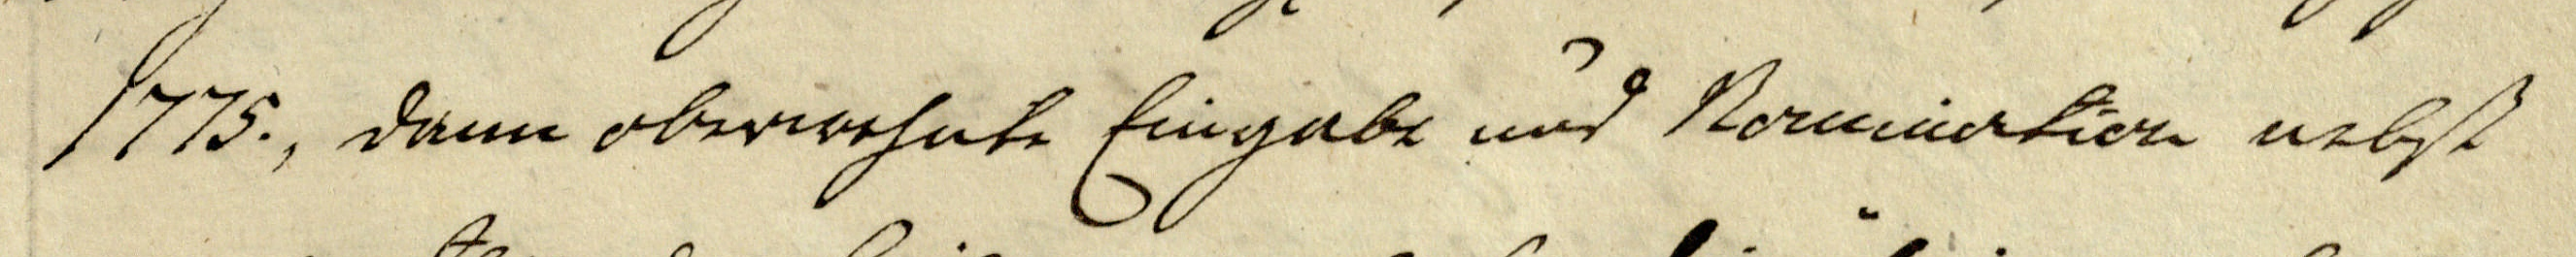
1775., dann oberwehnte Eingabe und Nomination nebst
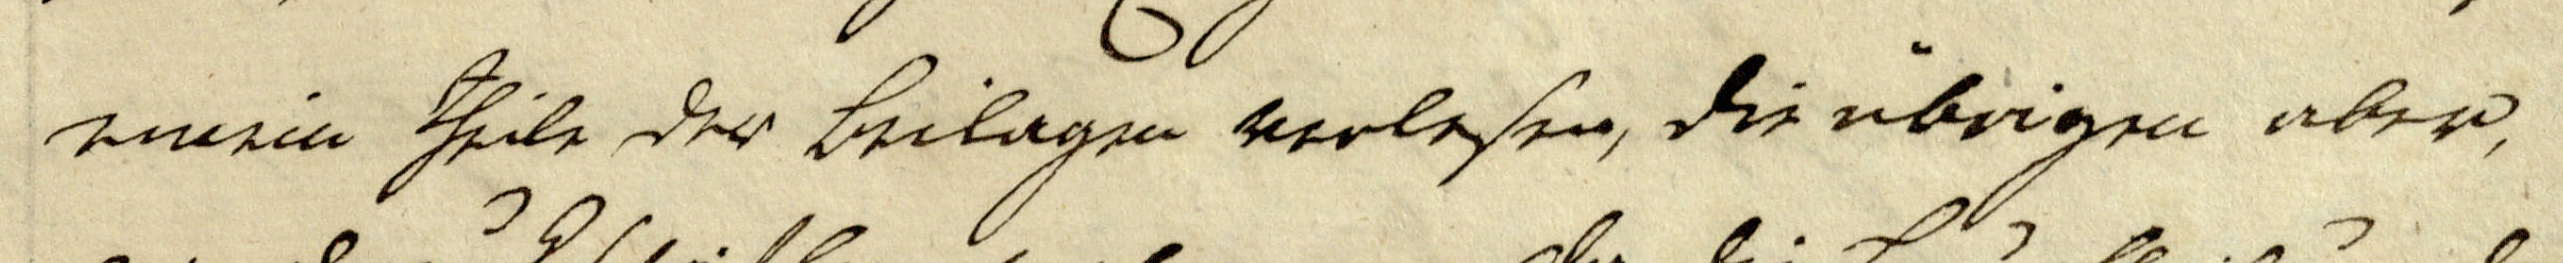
einem Theile der Beilagen verlesen, die übrigen aber,
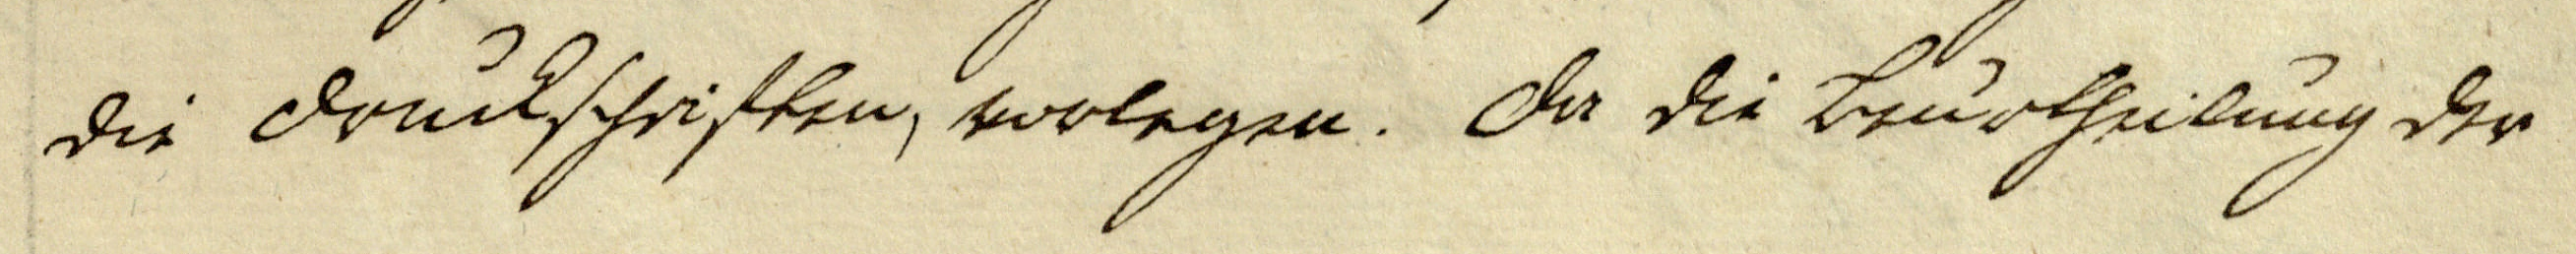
die Druckschriften, vorlegen. Da die Beurtheilung der
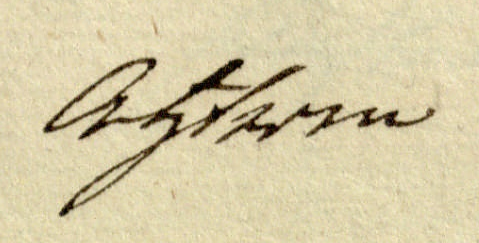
letzteren
